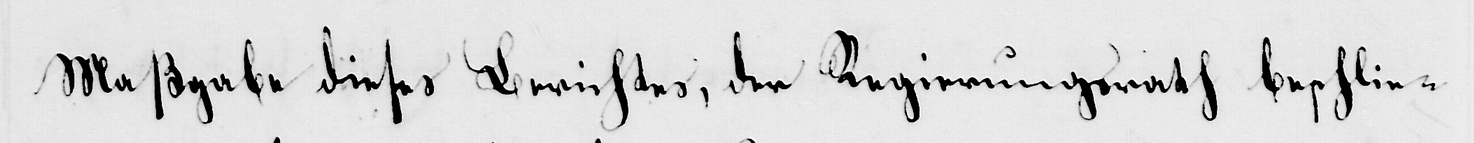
Maßgabe dieses Berichtes, der Regierungsrath beschlie¬
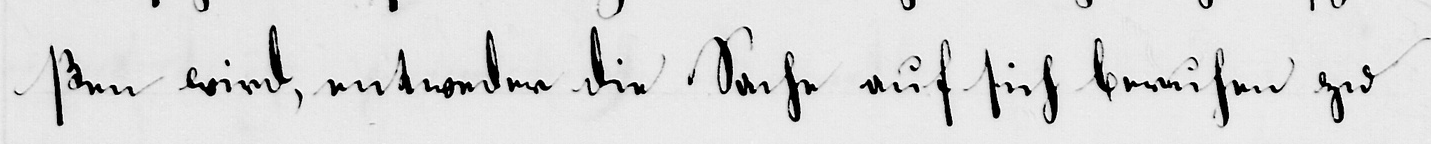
ßen wird, entweder die Sache auf sich beruhen zu
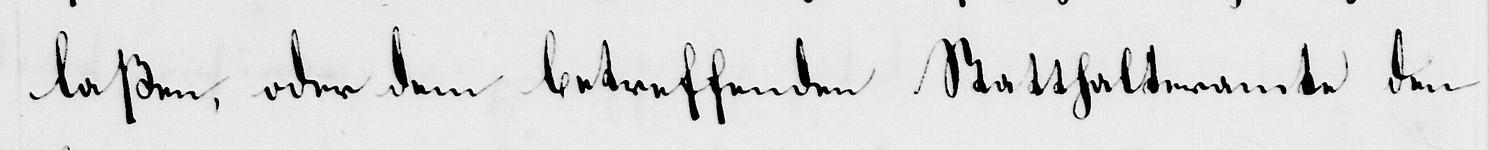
laßen, oder dem betreffenden Statthalteramte den
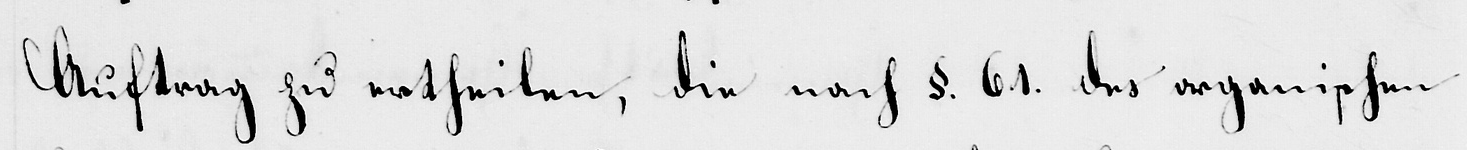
Auftrag zu ertheilen, die nach §. 61. des organischen
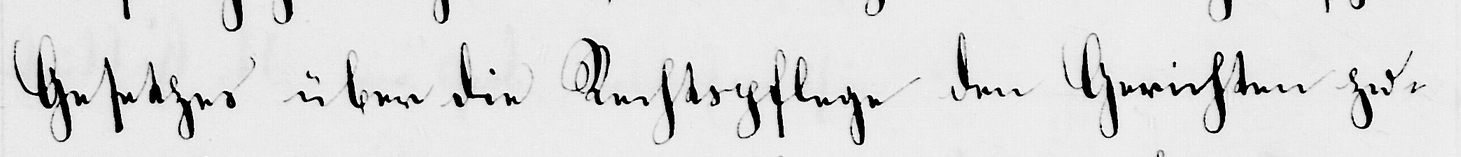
Gesetzes über die Rechtspflege den Gerichten zu¬
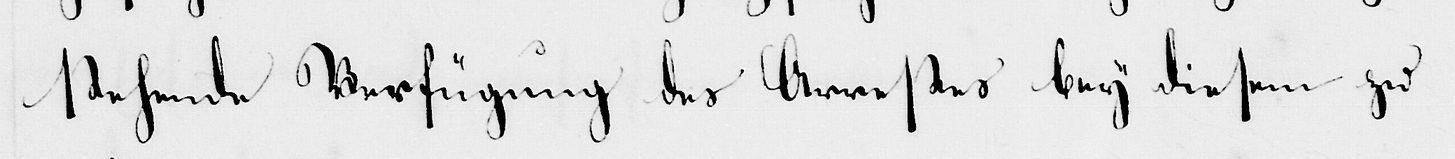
stehende Verfügung des Arrestes bey diesem zu
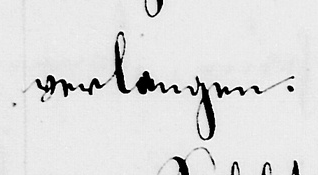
verlangen.
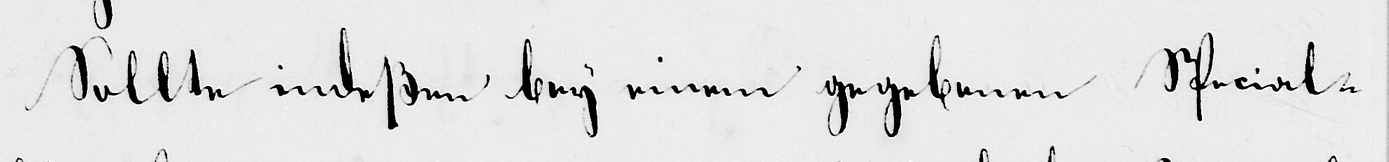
Sollte indeßen bey einem gegebenen Special¬
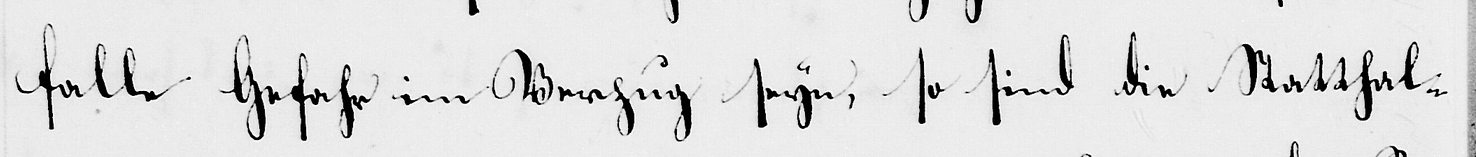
falle Gefahr im Verzug seyn, so sind die Statthal¬
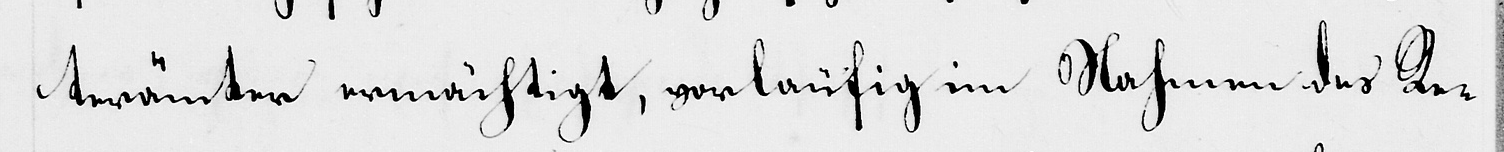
terämter ermächtigt, vorläufig im Nahmen des Re¬
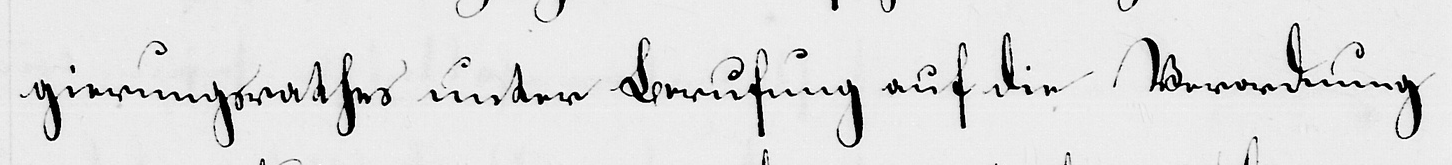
gierungsrathes unter Berufung auf die Verordnung
